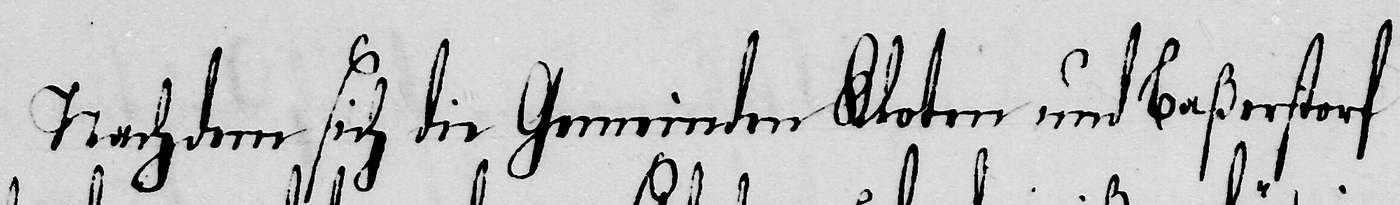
Nachdem sich die Gemeinden Kloten und Baßerstorf
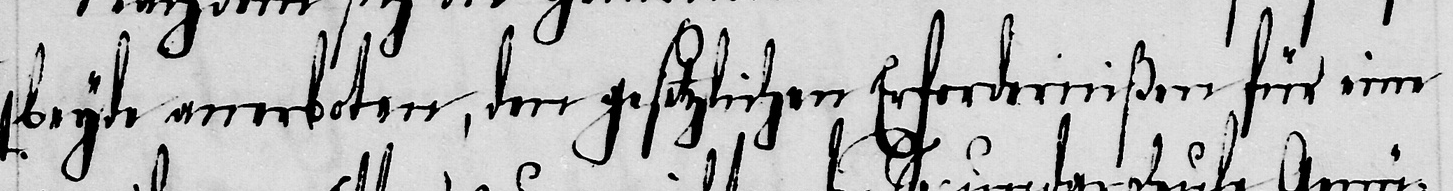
beyde anerboten, den gesetzlichen Erfordernißen für eine
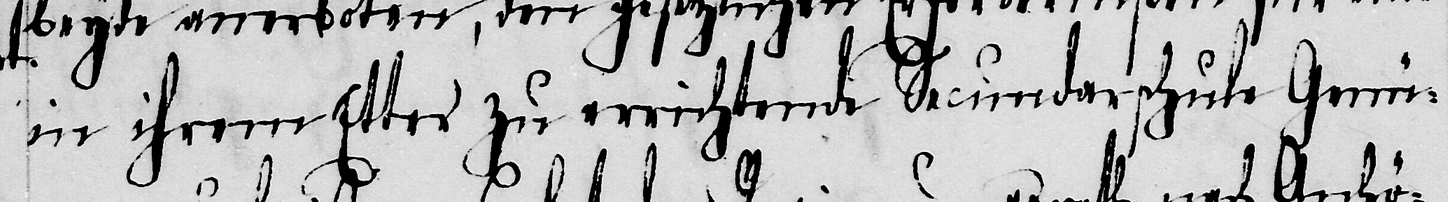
in ihrem Etter zu errichtende Secundarschule Genü¬
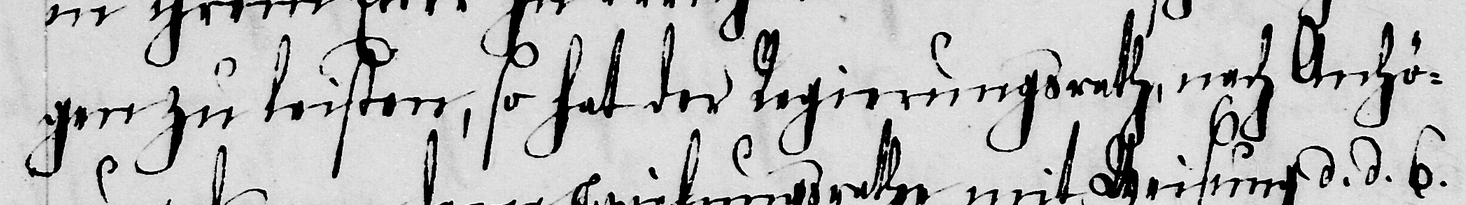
gen zu leisten, so hat der Regierungsrath, nach Anhö¬
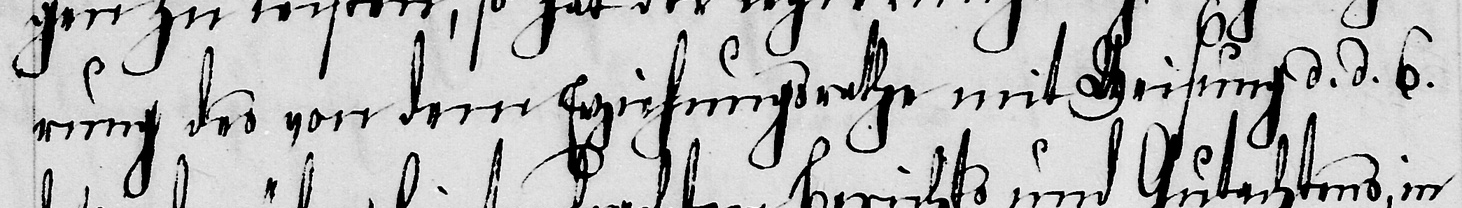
rung des von dem Erziehungsrathe mit Weisung d.d. 6.
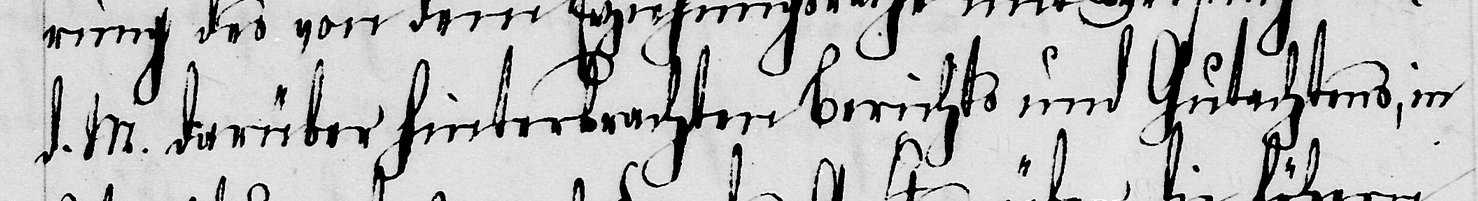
d. M. darüber hinterbrachten Berichtes und Gutachtens,
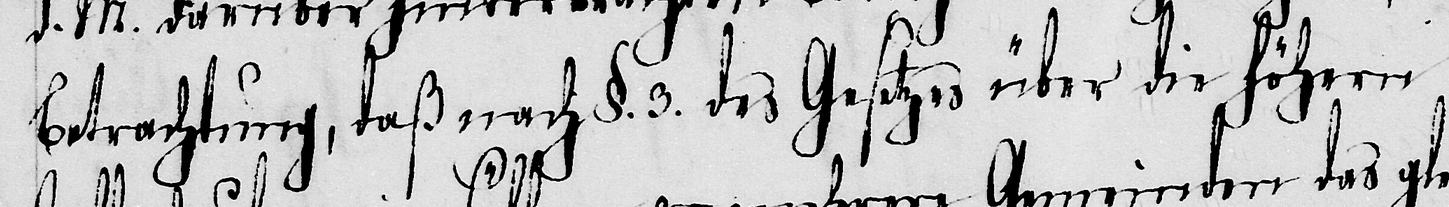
Betrachtung, daß nach §. 3. des Gesetzes über die höhern
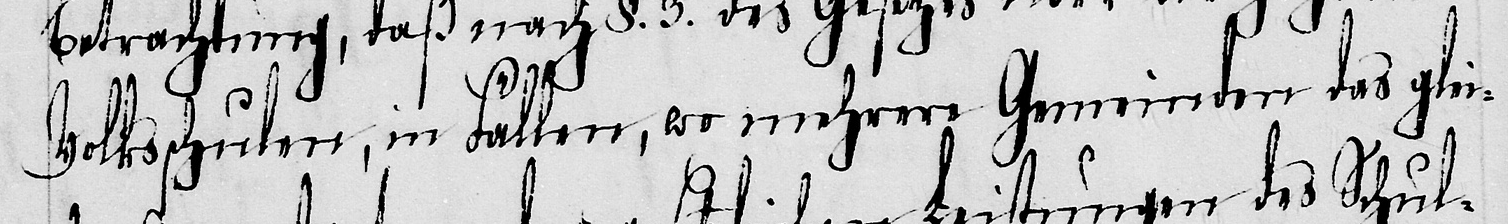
Volksschulen, in Fällen, wo mehrere Gemeinden das glei¬
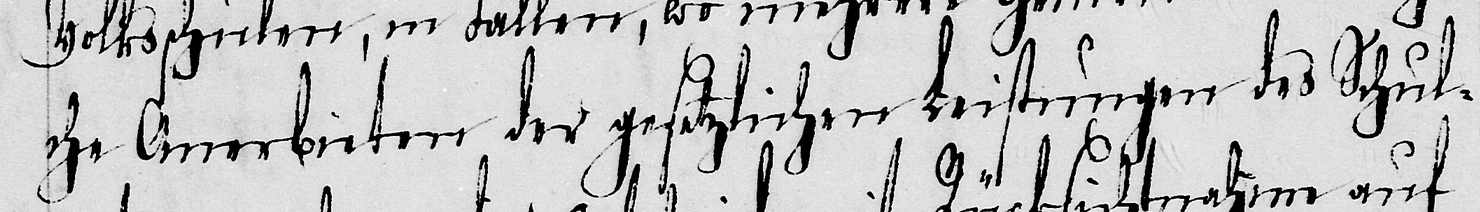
che Anerbieten der gesetzlichen Leistungen des Schul¬
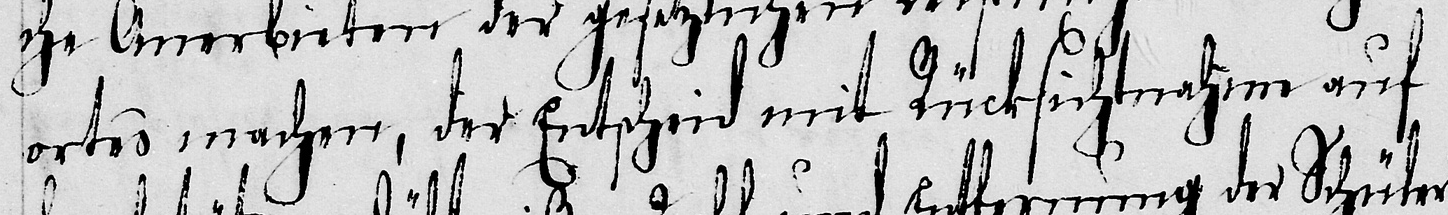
ortes machen, der Entscheid mit Rücksichtnahme auf
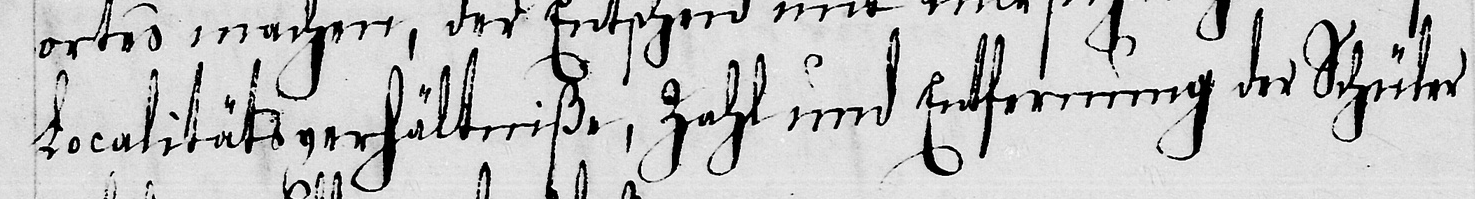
Localitätsverhältniße, Zahl und Entfernung der Schüler
